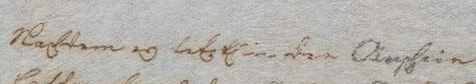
Nachdem es letzthin den Anschein
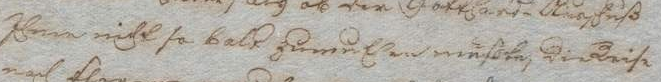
Ihnen nicht so bald zumuthen müßte, die Reise
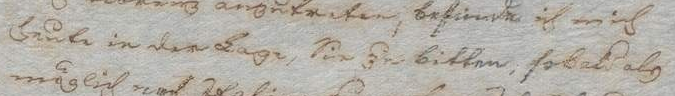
heute in der Lage, Sie zu bitten, sobald als
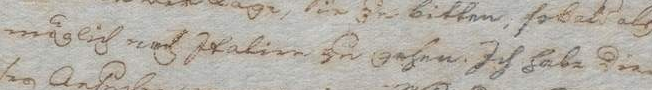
möglich nach Italien zu gehen. Ich habe die-
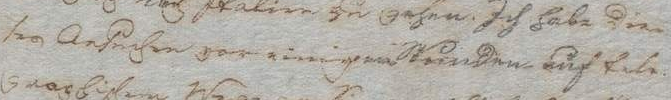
ses Ansuchen vor einigen Stunden auf tele-
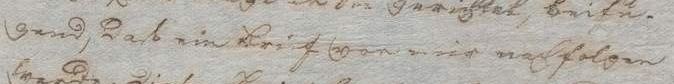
gend, daß ein Brief von mir nachfolgen
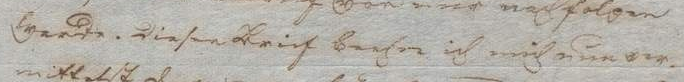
werde. Diesen Brief beehre ich mich nun ver-
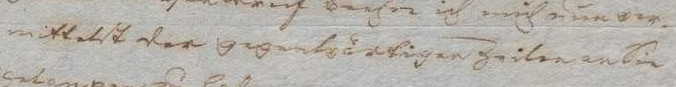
mittelst der gegenwärtigen Zeilen an Sie
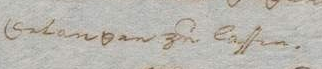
gelangen zu lassen.
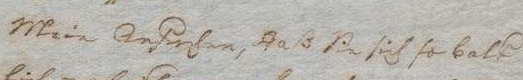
Mein Ansuchen, daß Sie sich so bald
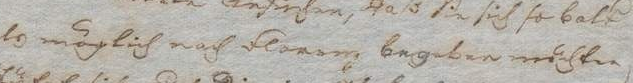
als möglich nach Florenz begeben möchten,
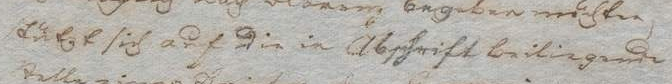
stützt sich auf die in Abschrift beiliegende
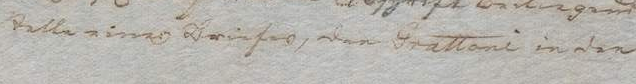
Stelle eines Briefes, den Grattoni in den
